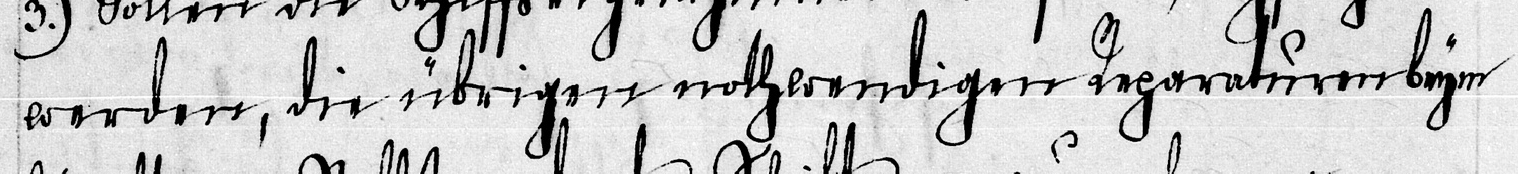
werden, die übrigen nothwendigen Reparaturen beym
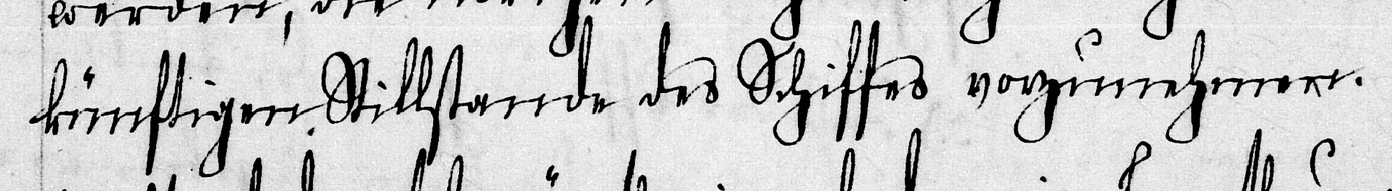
künftigen Stillstande des Schiffes vorzunehmen.
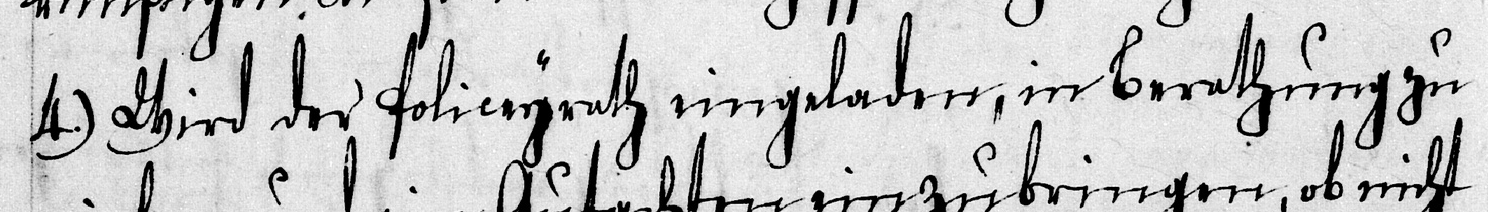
4.) Wird der Policeyrath eingeladen, in Berathung zu
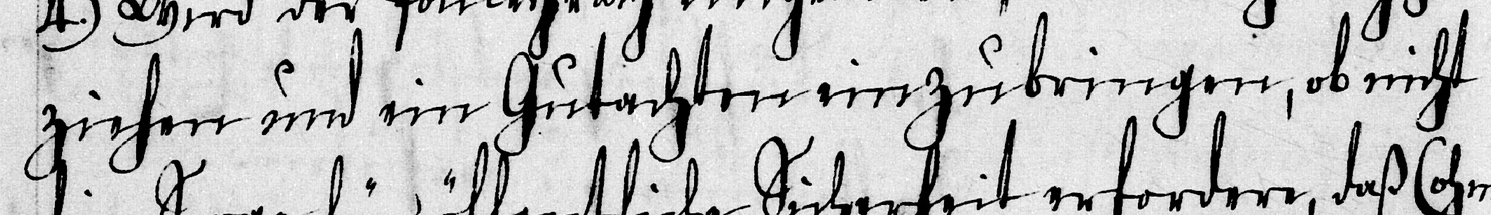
ziehen und ein Gutachten einzubringen, ob nicht
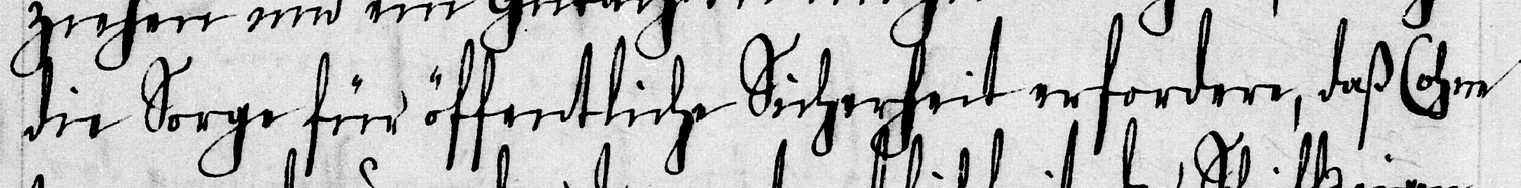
die Sorge für öffentliche Sicherheit erfordere, daß (ohne
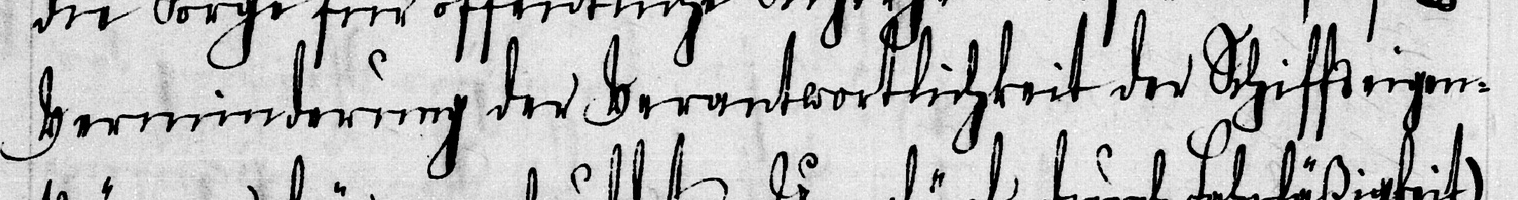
Verminderung der Verantwortlichkeit der Schiffseigen¬
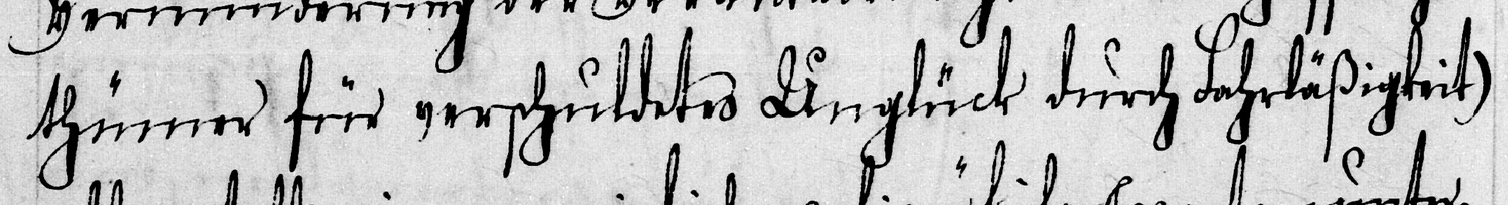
thümer für verschuldetes Unglück durch Fahrläßigkeit)
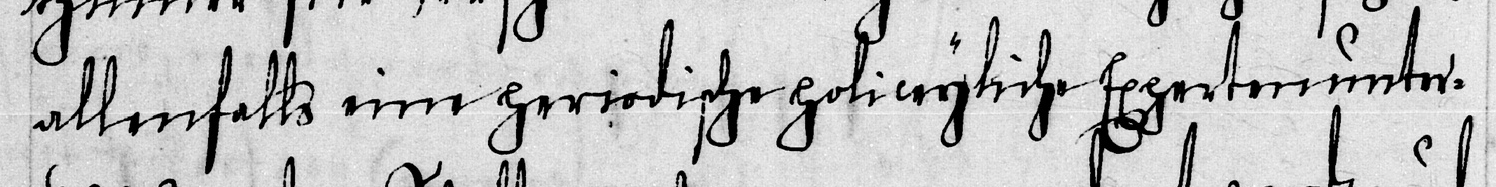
allenfalls eine periodische policeyliche Expertenunter¬
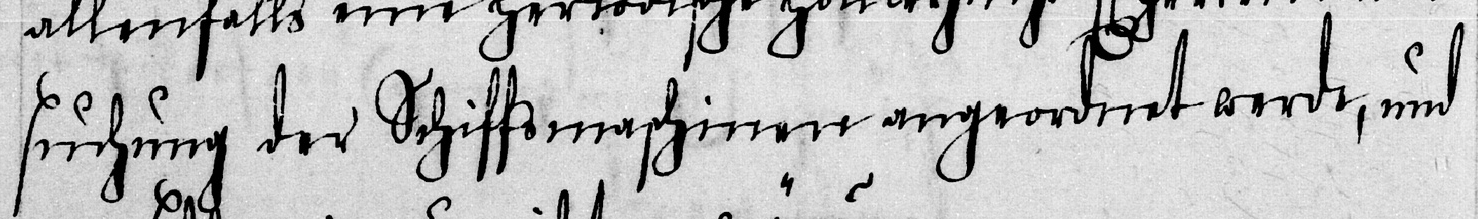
suchung der Schiffsmaschinen angeordnet werde, und
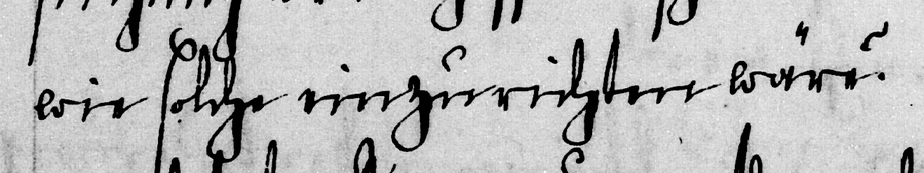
wie solche einzurichten wäre?
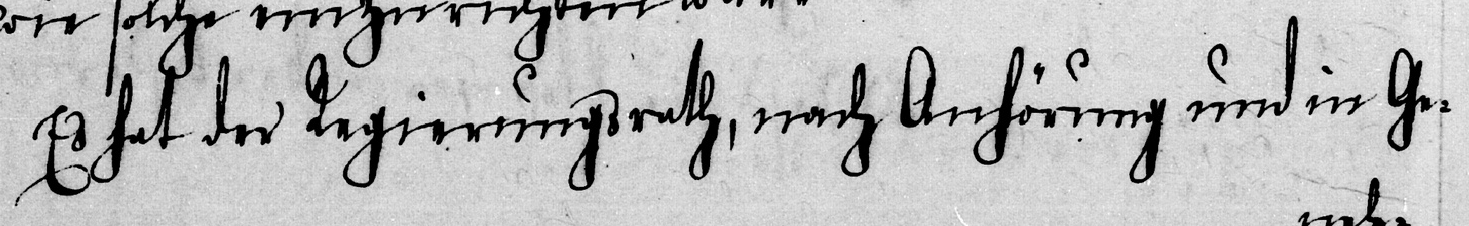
Es hat der Regierungsrath, nach Anhörung und in Ge-
